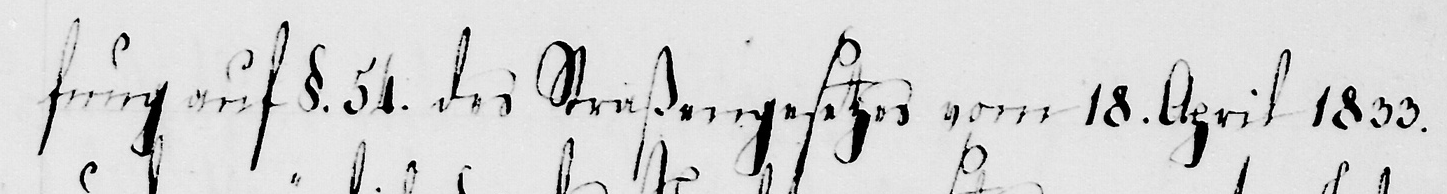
fung auf §. 54. des Straßengesetzes vom 18. April 1833.
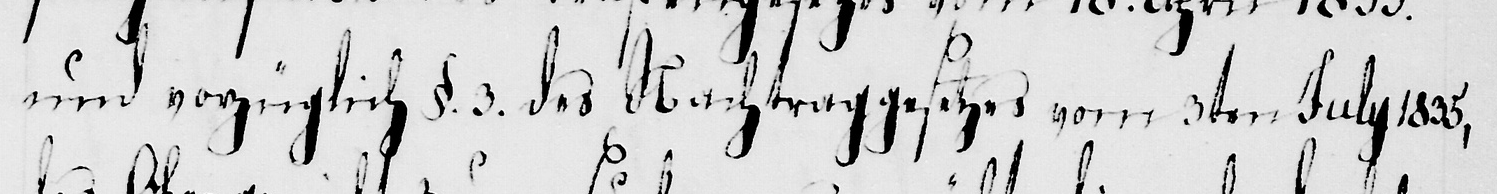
und vorzüglich §. 3. des Nachtraggesetzes vom 3ten July 1835,
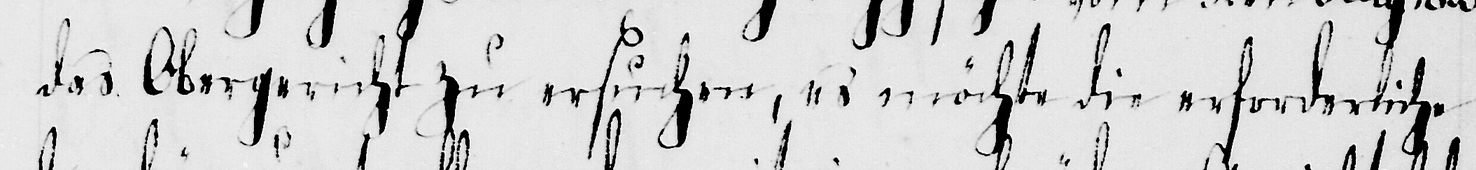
das Obergericht zu ersuchen, es möchte die erforderliche
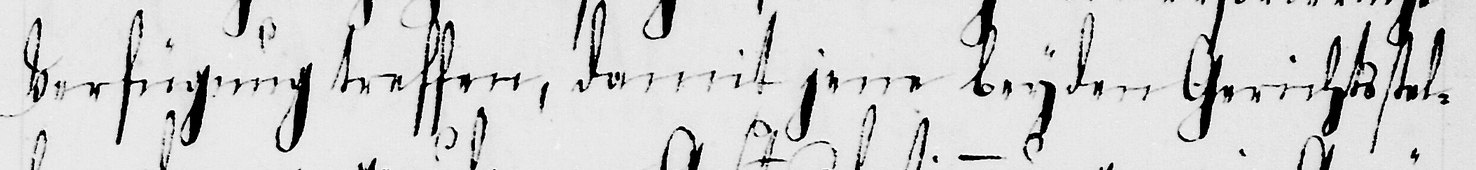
Verfügung treffen, damit jene beyden Gerichtsstel¬
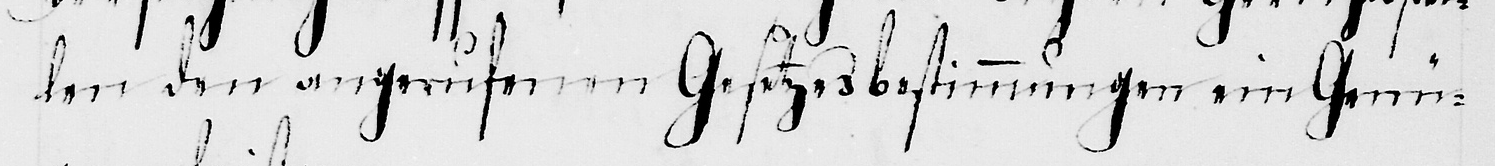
len den angerufenen Gesetzesbestimmungen ein Genü¬
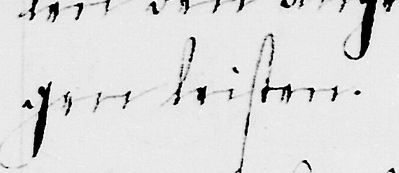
gen leisten.
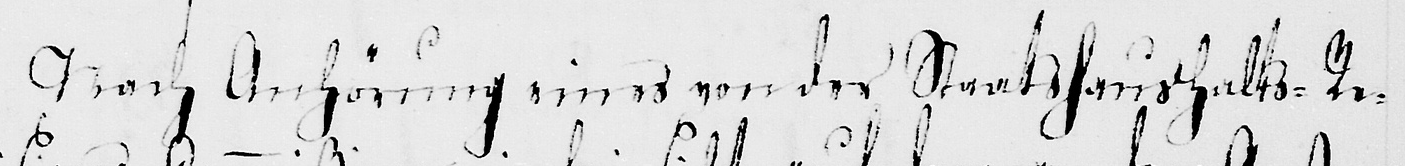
Nach Anhörung eines von der Staatshaushalts-Re¬
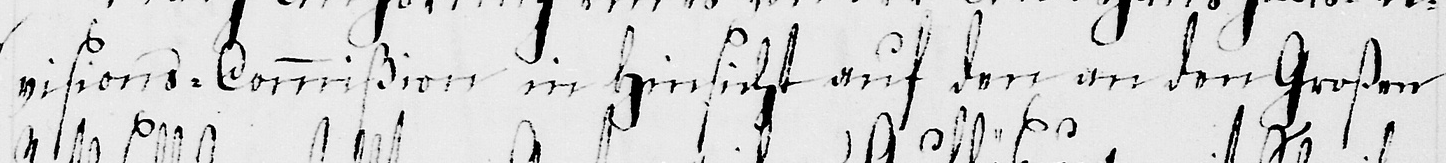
visions-Commißion in Hinsicht auf den an den Großen
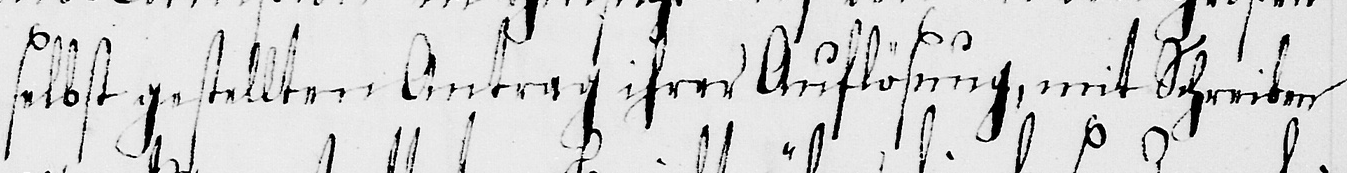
selbst gestellten Antrag ihrer Auflösung, mit Schreiben
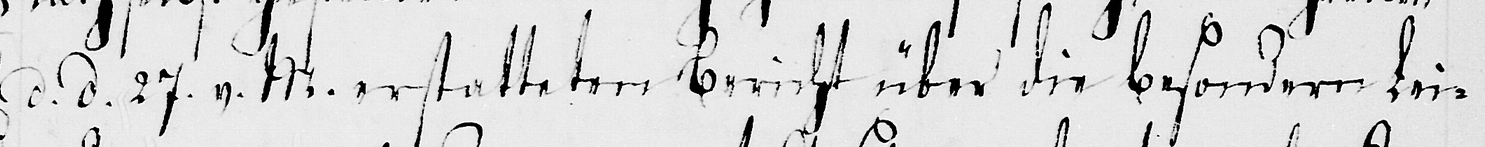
d. d. 27. v. M. erstatteten Bericht über die besondern Lei¬
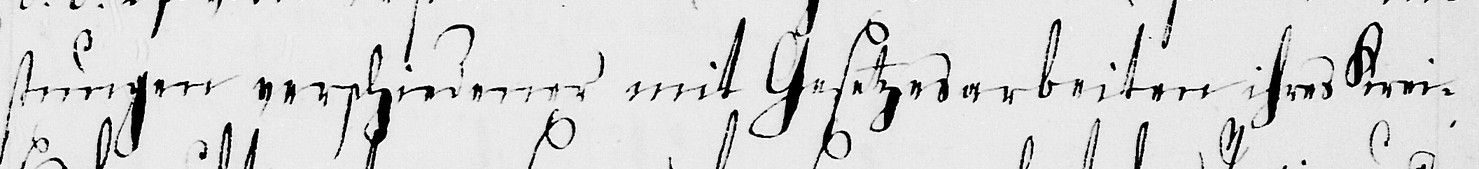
stungen verschiedener mit Gesetzesarbeiten ihres Krei¬
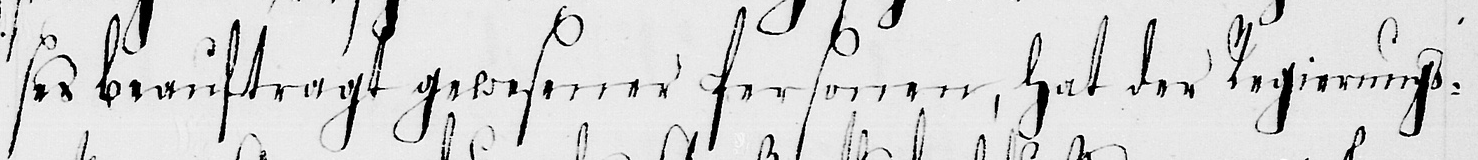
ses beauftragt gewesener Personen, hat der Regierungs¬
